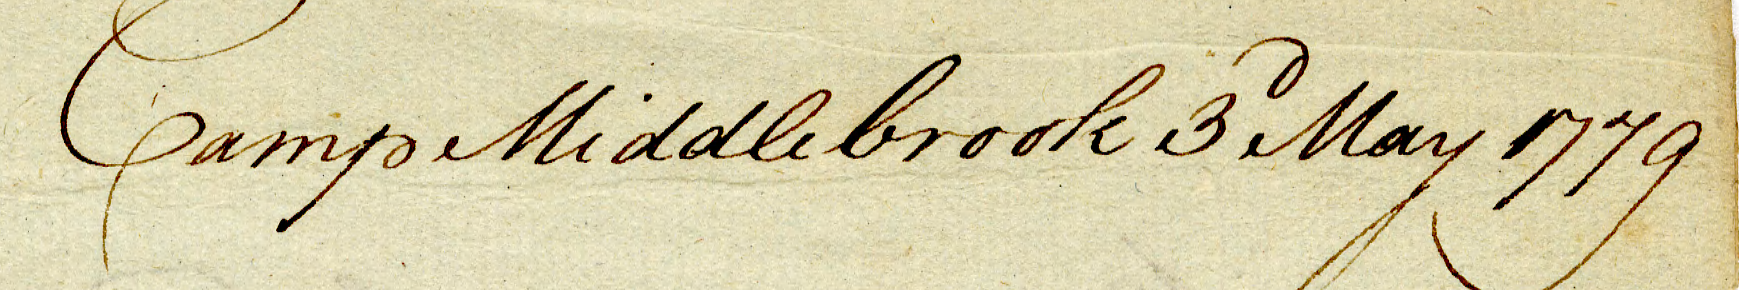Camp Middlebrook 3^d May 1779
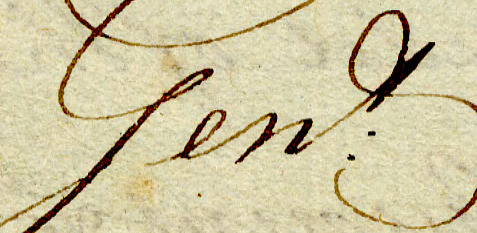Gen^t:
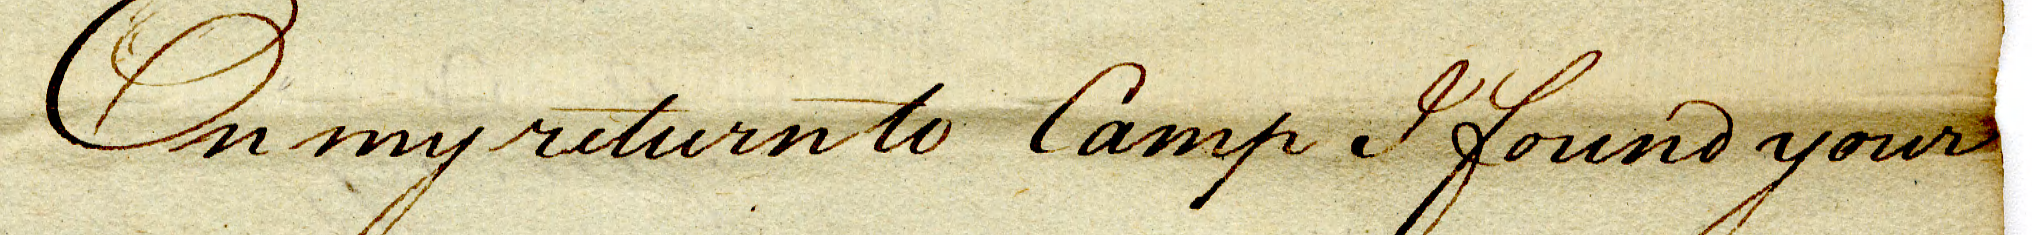On my return to Camp I found your
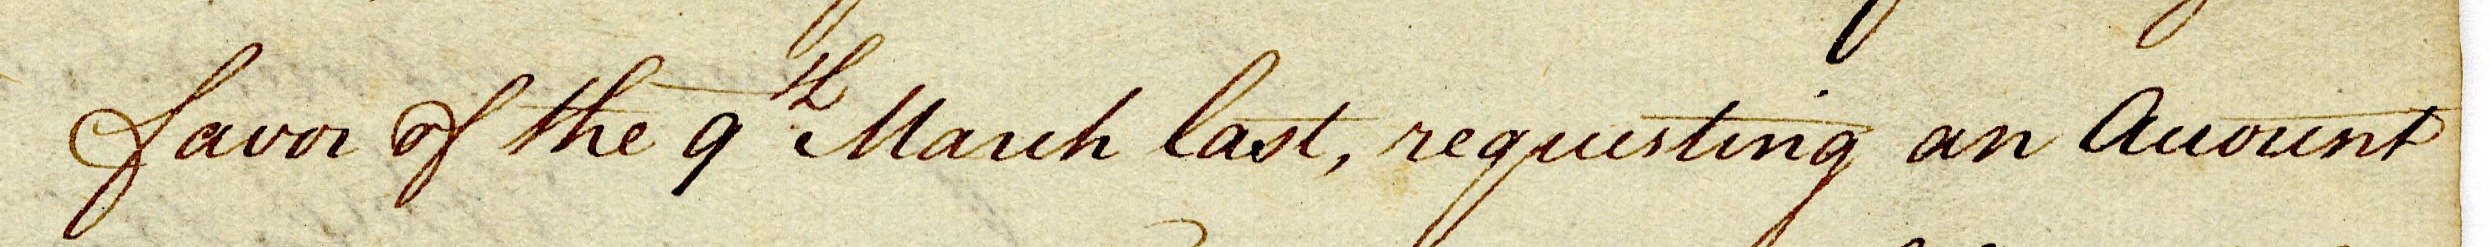favor of the 9^th March last, requesting an Account
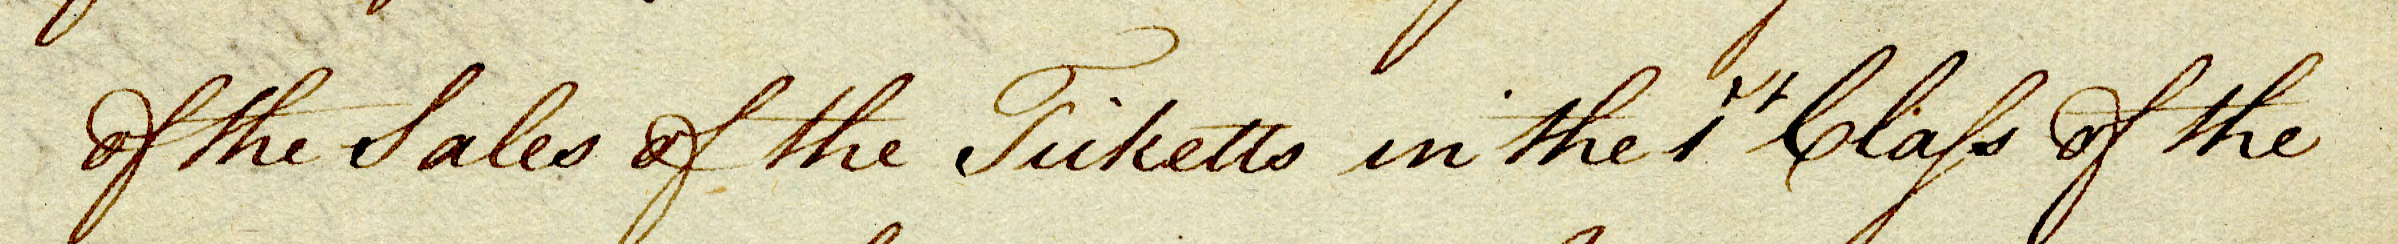of the Sales of the Ticketts in the 1^st Class of the
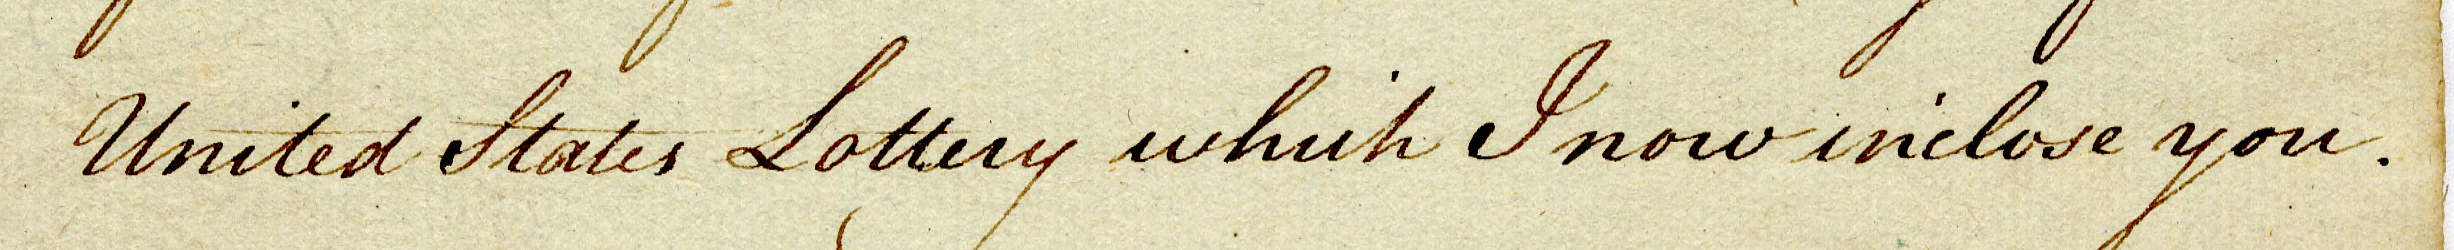United States Lottery which I now inclose you.
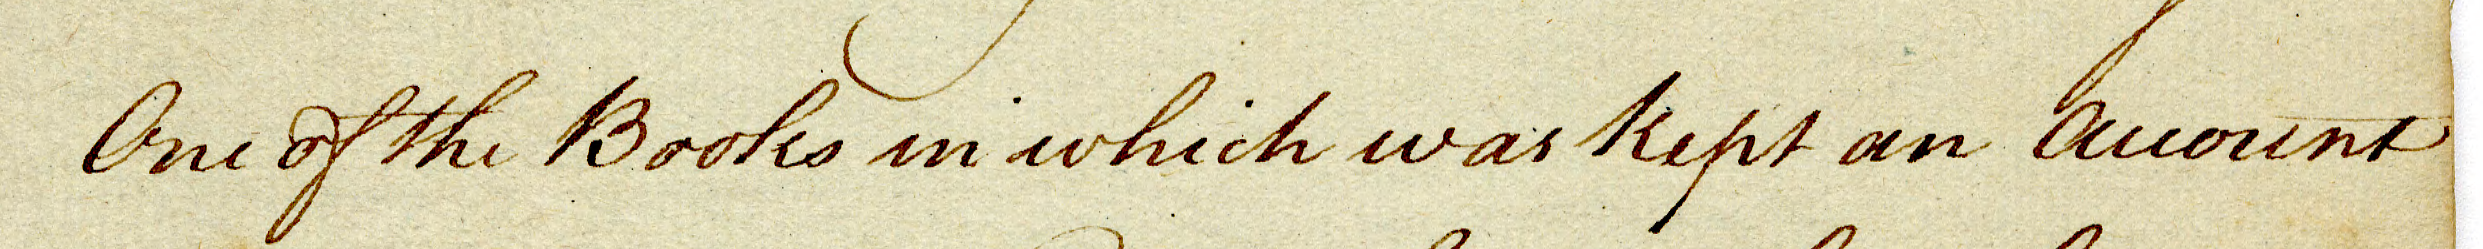One of the Books in which was kept an account
